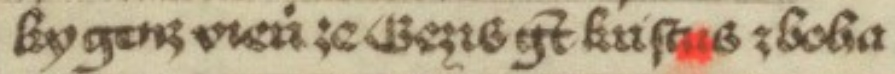ky genz vieṙi ze Gezis g̑t kriſtus z boha
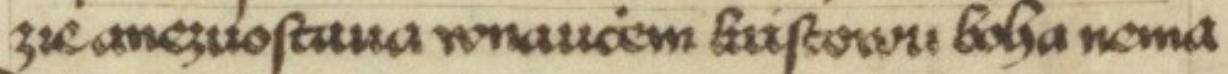zie anezuoſtaua wnauċem kriſtwu boha nema
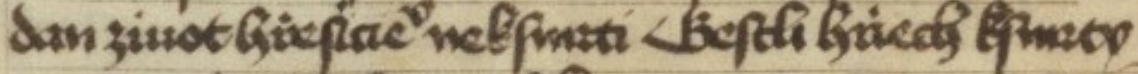dan ziuot hṙeẛiciev nebſmrti Geſtli hṙiech kſmrty
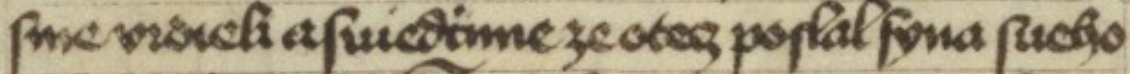ſme vidieli a ſuiedċime ze otecz poſlal ſyna ſueho
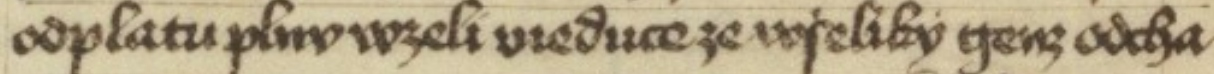odplatu plnv wzeli vieduce ze wẛeliky genz odcha
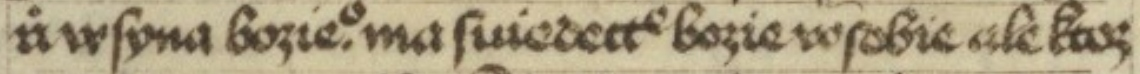ṙi wſyna bozie.° ma ſuiedecte bozie wſobie ale ktoz
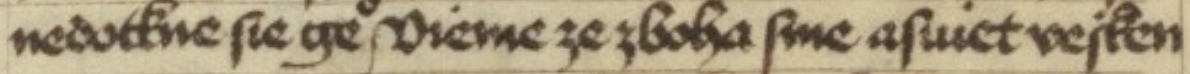nedotkne ſie ge° Vieme ze zboha ſme aſuiet veẛken
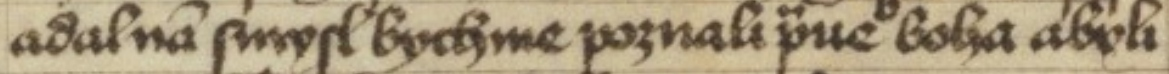adal nȃ ſmyſl bychme poznali p̃ue° boha abyli
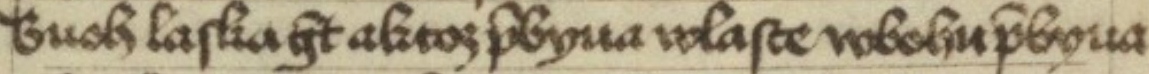Buoh laſka g̑t aktoz p̄byua wlaſce wbohu p̄byua
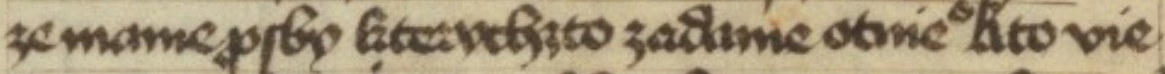ze mame ꝓſby kterychzto zadanie otnie° kto vie
